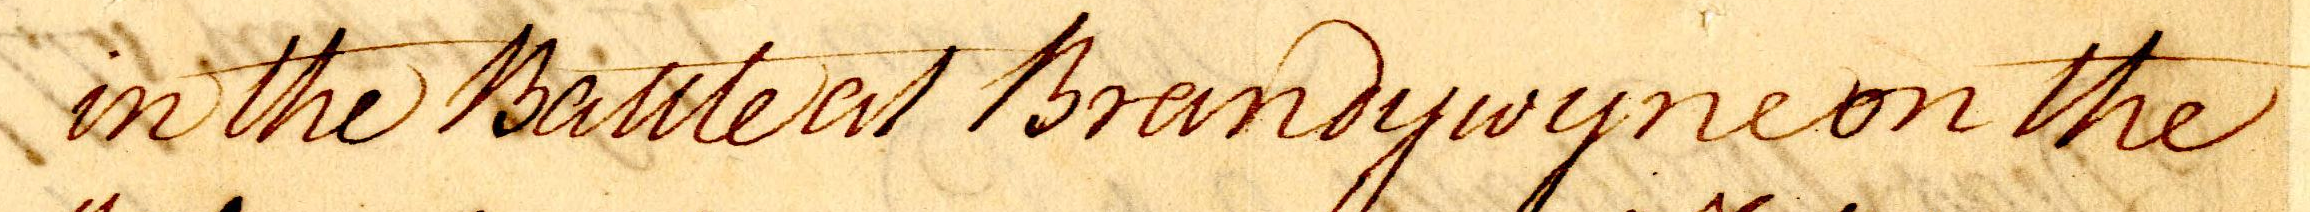in the Battle at Brandywyne on the
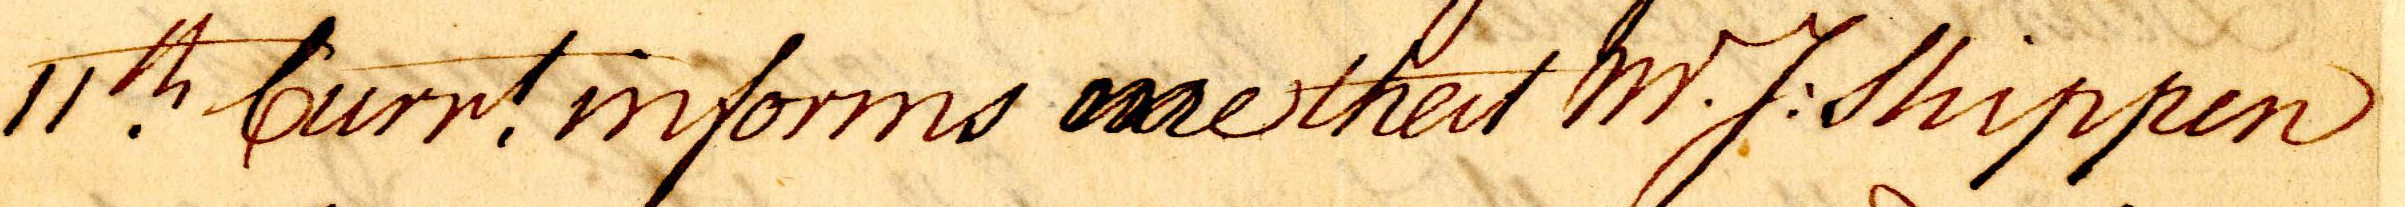11^th Curr^t. informs one that M^r. J. Shippen
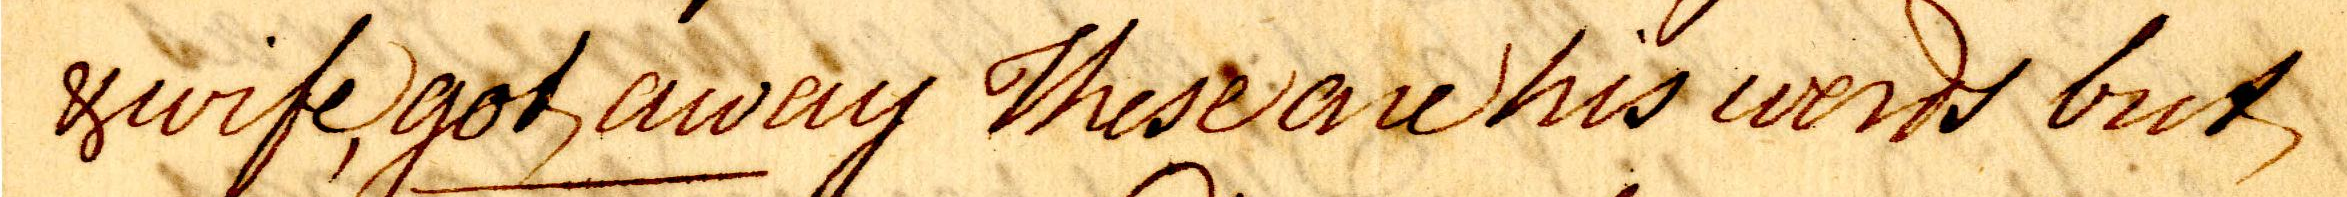& wife, got away These are his words but
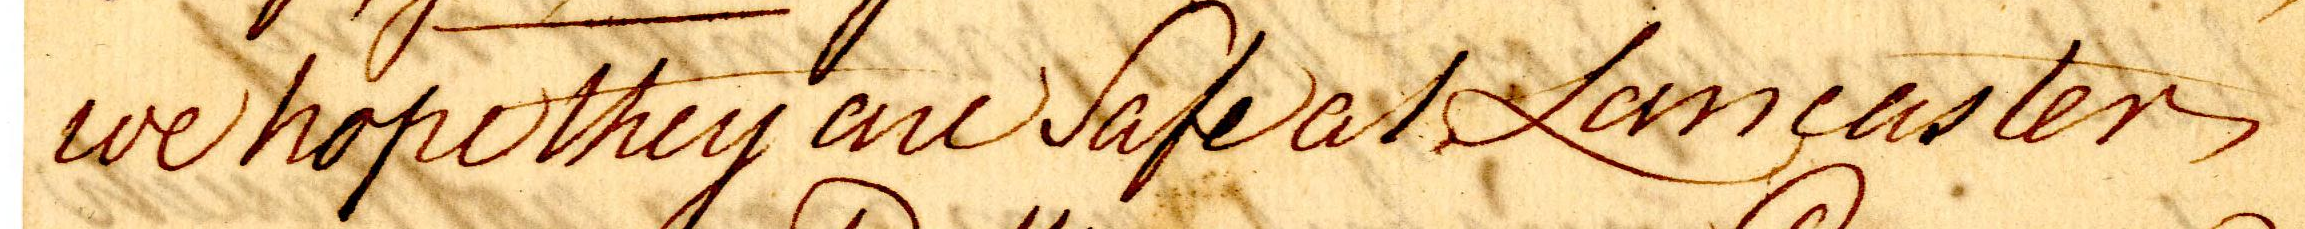we hope they are safe at Lancaster
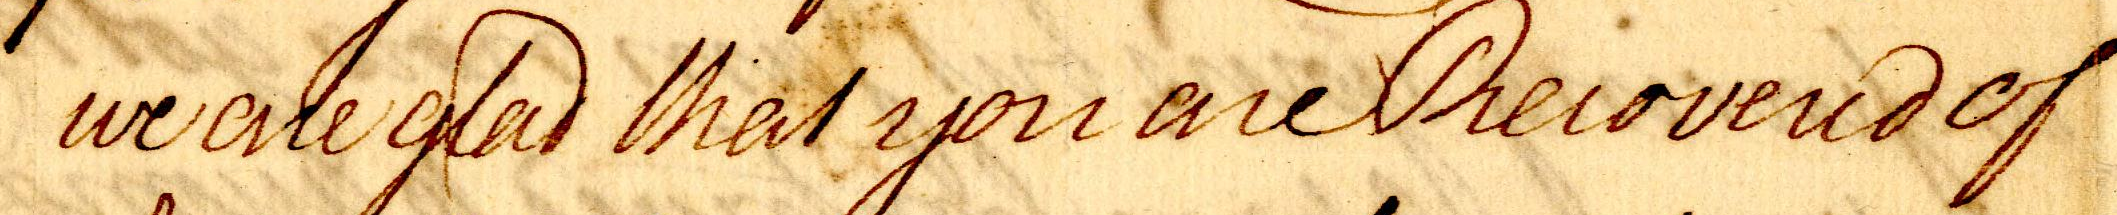we are glad that you are Recoverd of
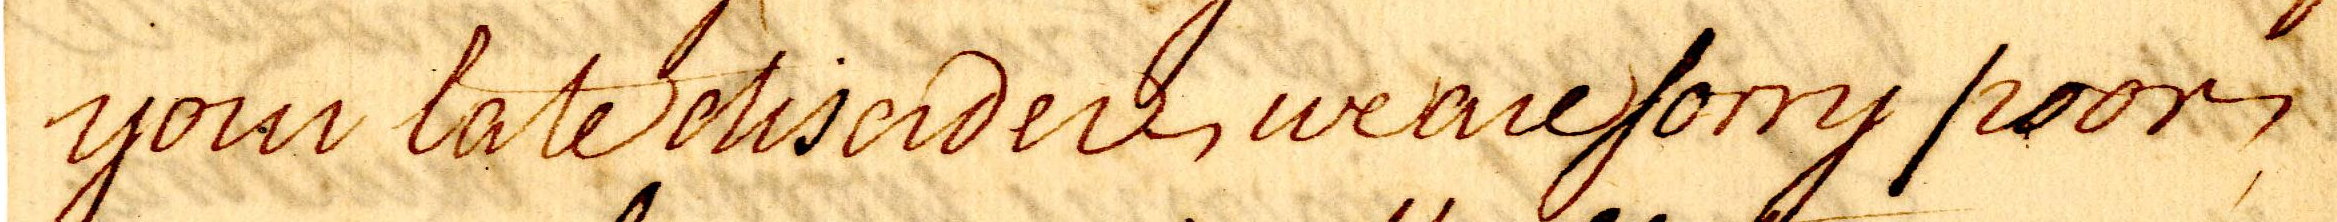your late disorders, we are sorry poor
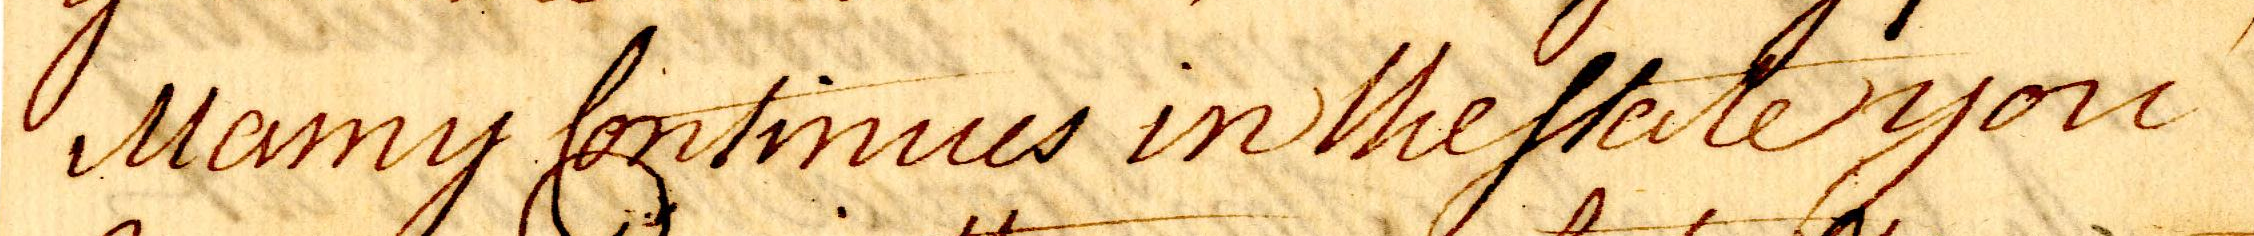Mamy Continues in the state you
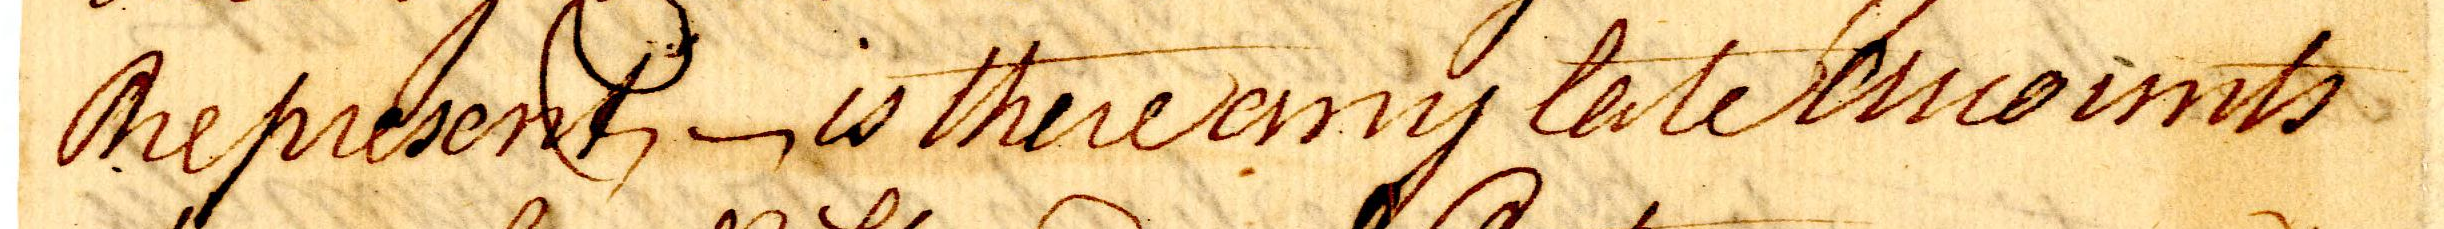the present- is there any late accounts
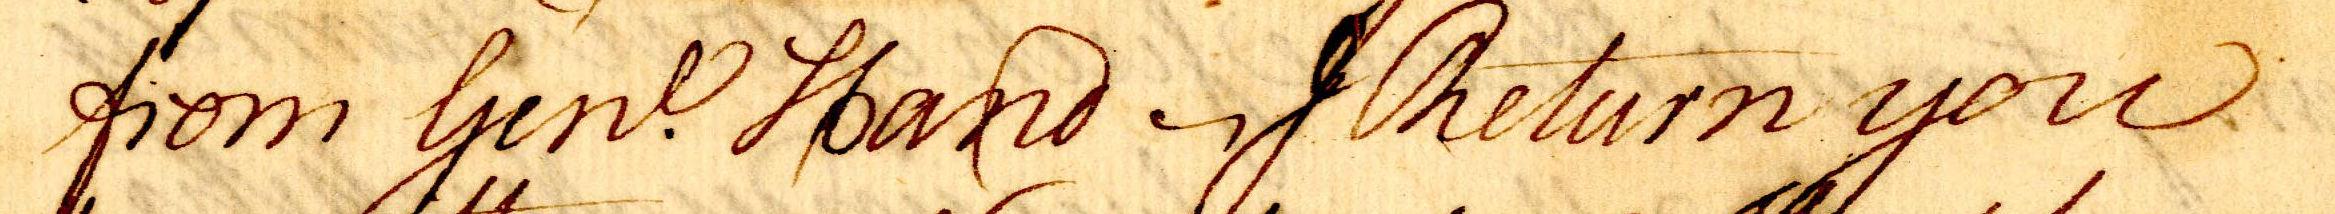from Gen^l. Hand- I Return you
